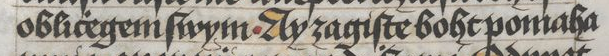obliċegem ſwym.Ay zagiſte boht pomaha
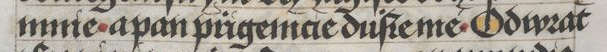mnie.a pan pṙigemcie duẛie mé.Odwrat
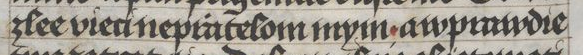zlee vieci nepṙatelom mym.a wprawdie
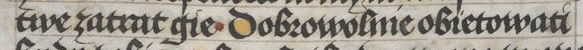twe zatrat gie.Dobrowolníe obietowati
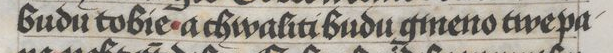budu tobie.a chwaliti budu gmeno twe pa¬
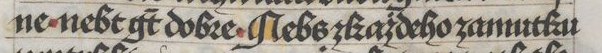ne.nebt ḡt dobre.Nebe zkażdeho zarmutku
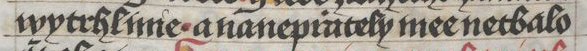wytrhl mie.a nanepṙately mee netbalo
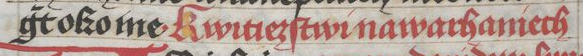ḡt oko me.Kwitiezſtwí nawarhaníech
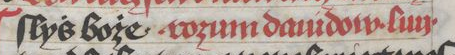ſlyš boże.rozum dauidow.liiij.
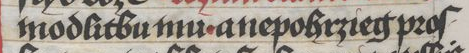modlitbu mu.a nepohrzieg proſ¬
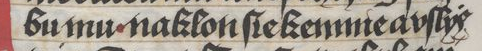bu mu.naklon ſie kemnie a vſlyš
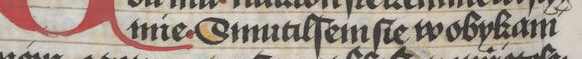mie.Smutilſem ſie w obykaní
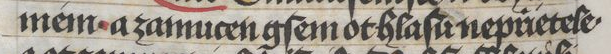mém.a zamucen gſem ot hlaſu nepṙíetele.
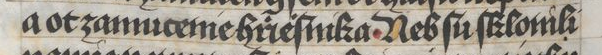a ot zamuceníe hřieſnika.Neb ſu ſklonili
